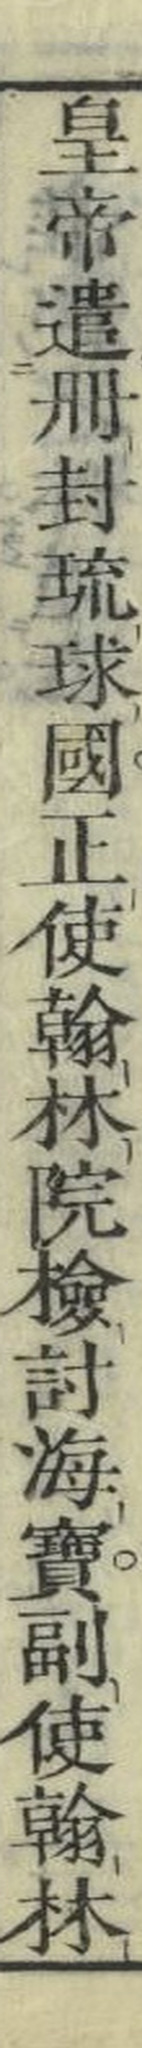皇-帝遣冊-封琉-球-國。正-使翰-林-院檢-討海-寶。副-使翰-林-
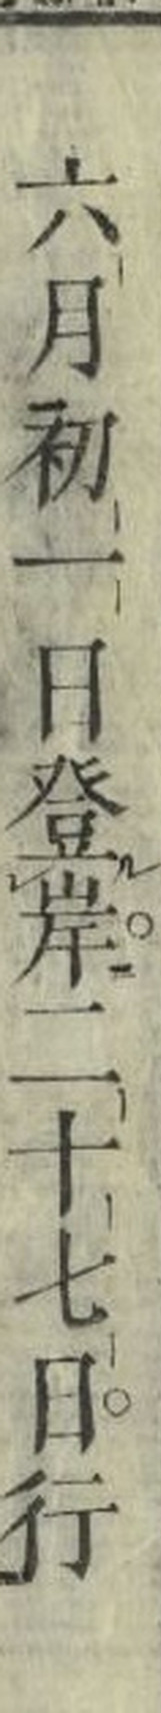六-月初-一-日登岸。二-十-七-日。行

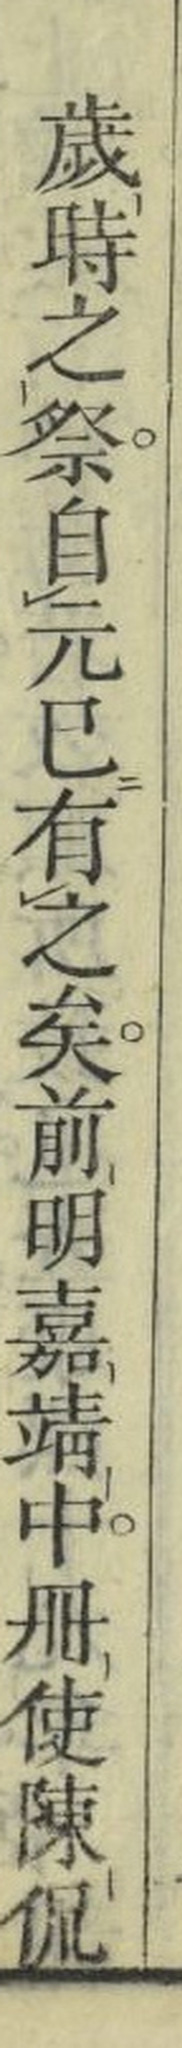歲-時之-祭。自元巳有之矣。前-明嘉-靖-中。冊-使陳-侃
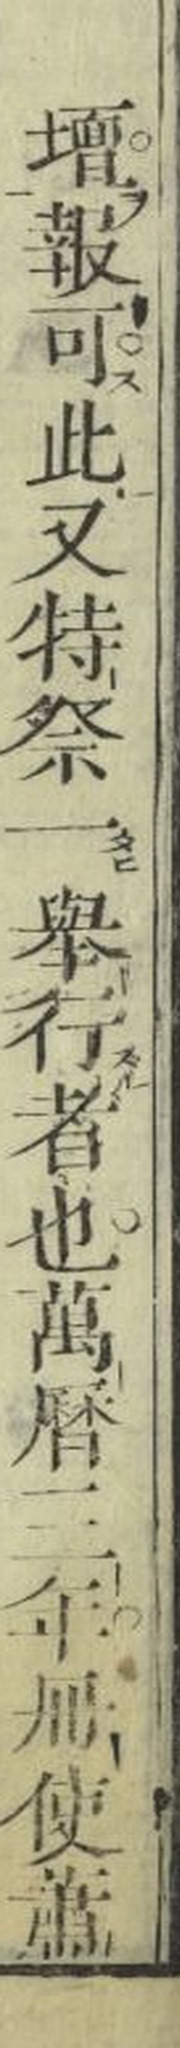壇。報-可。此又特-祭一舉-行者也。萬-曆三-年。冊-使蕭-

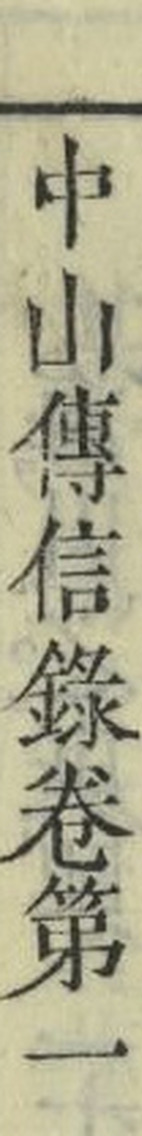中山傳信錄卷第一
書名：中山伝信録 巻一
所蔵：University of the Ryukyus Library
